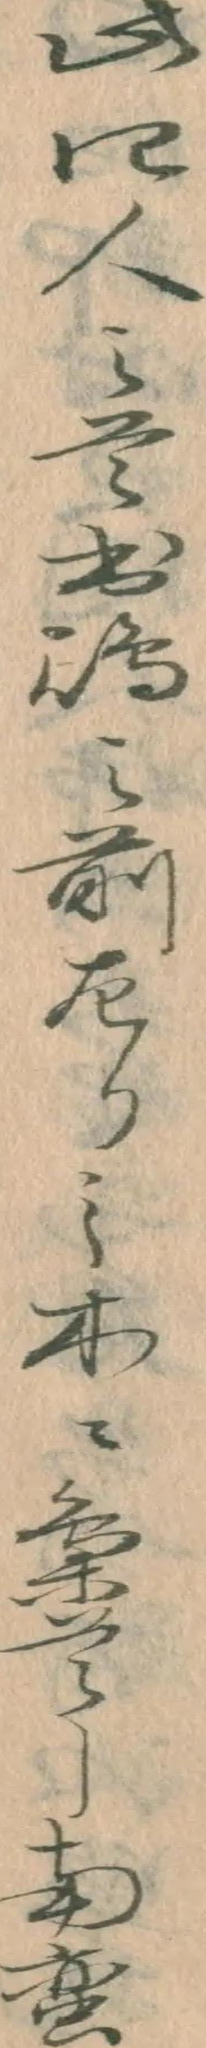此四人之首出島之前左り之木に乗首し南蛮
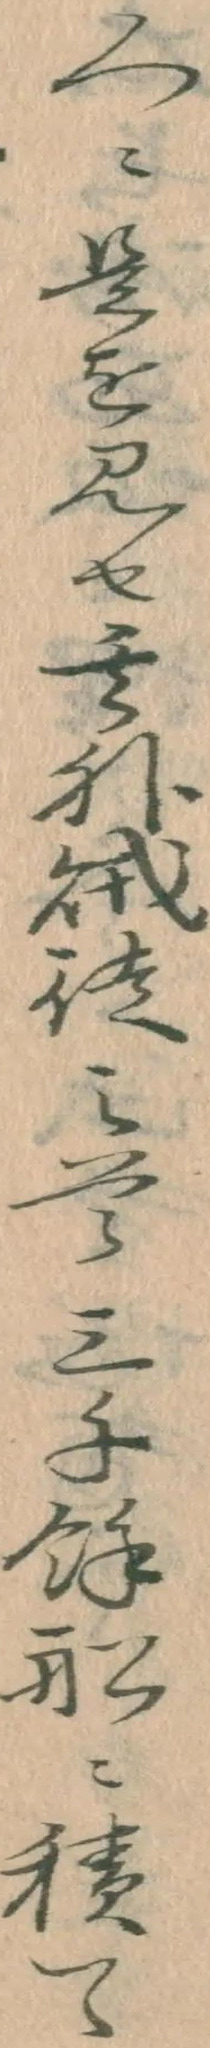人に是を見せ其外賊徒之首三千余舩に積て
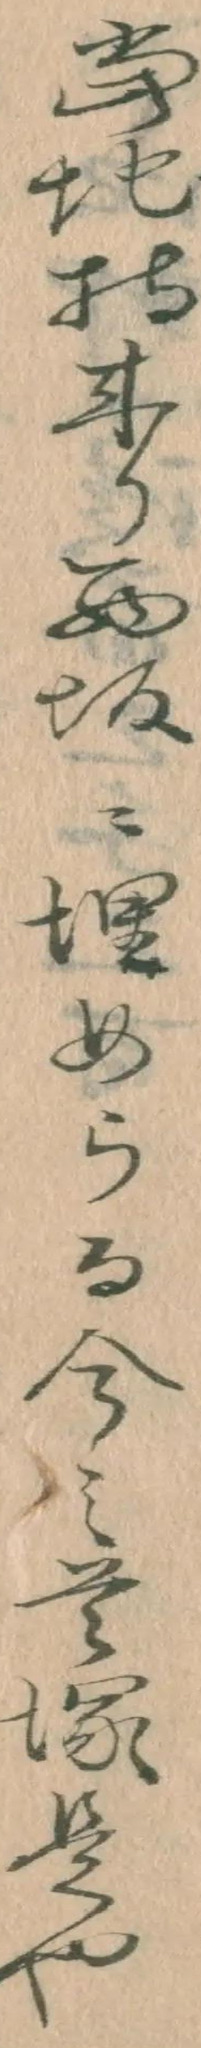当地持来り西坂に埋めらる今之首塚是也
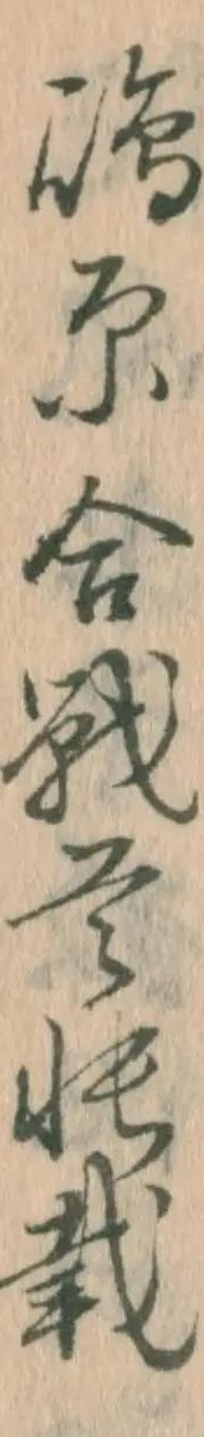島原合戦首帳載
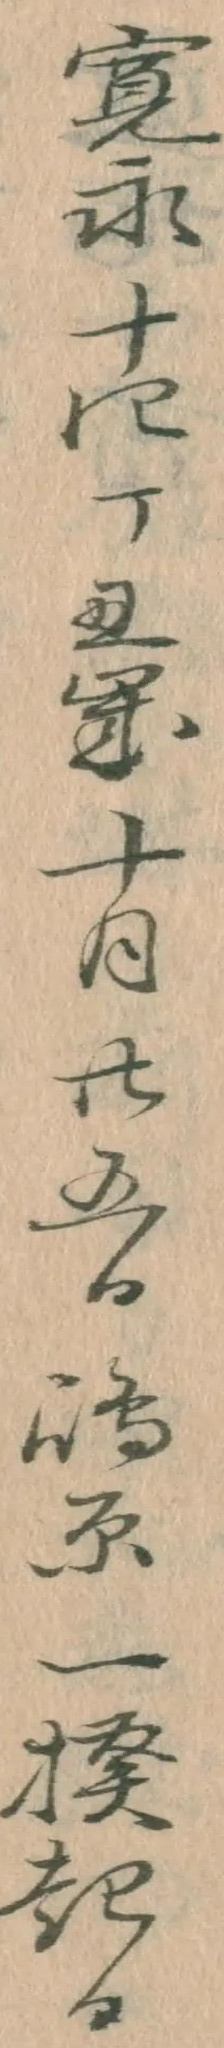寛永十四丁丑歳十月廿五日島原一揆起る
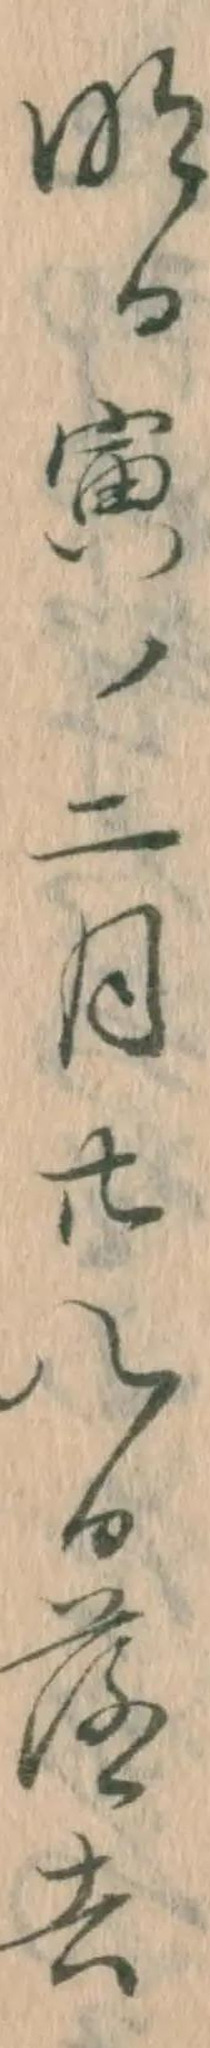明る寅之二月廿八日落去
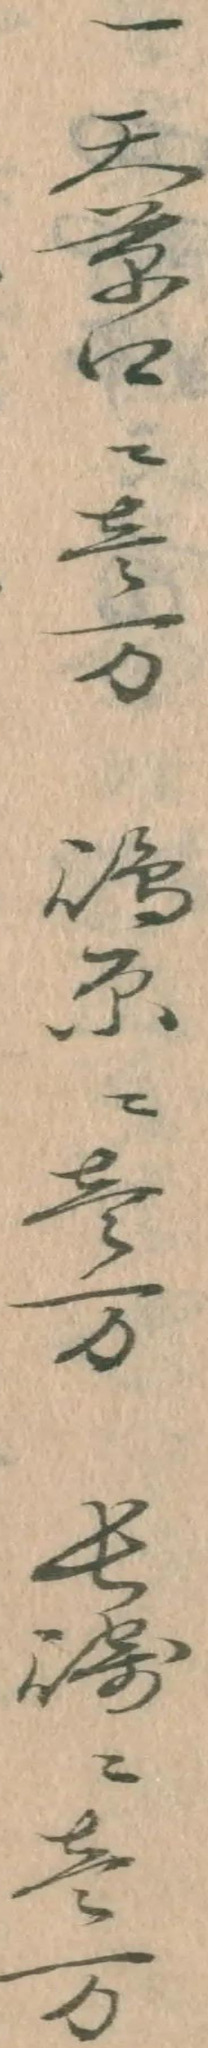一天草口に壱万島原に壱万長崎に壱万
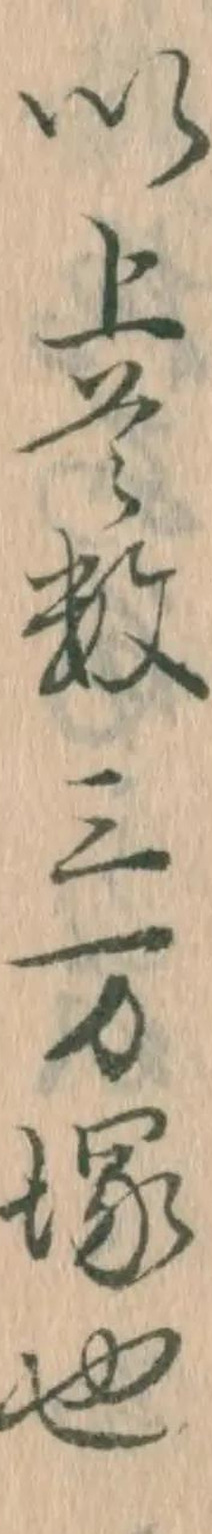以上首数三万塚也
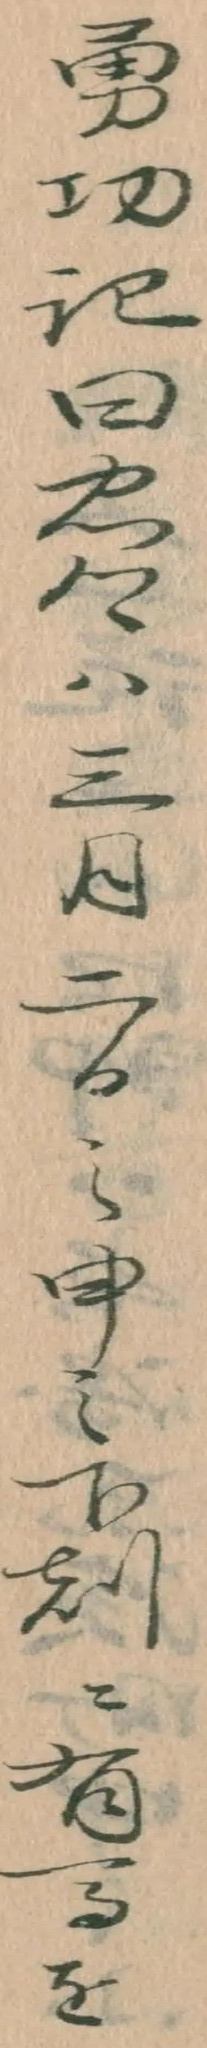勇功記曰忠郷は三月二日之申之下刻に有馬を
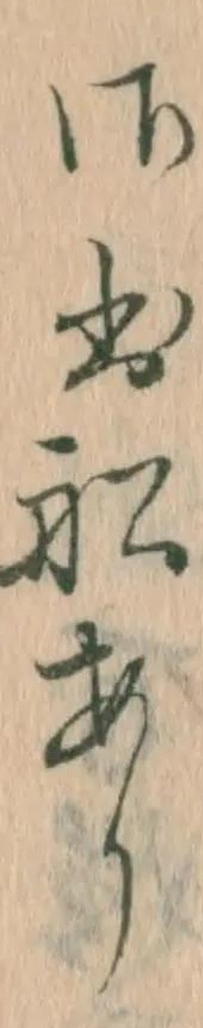御出舩あり
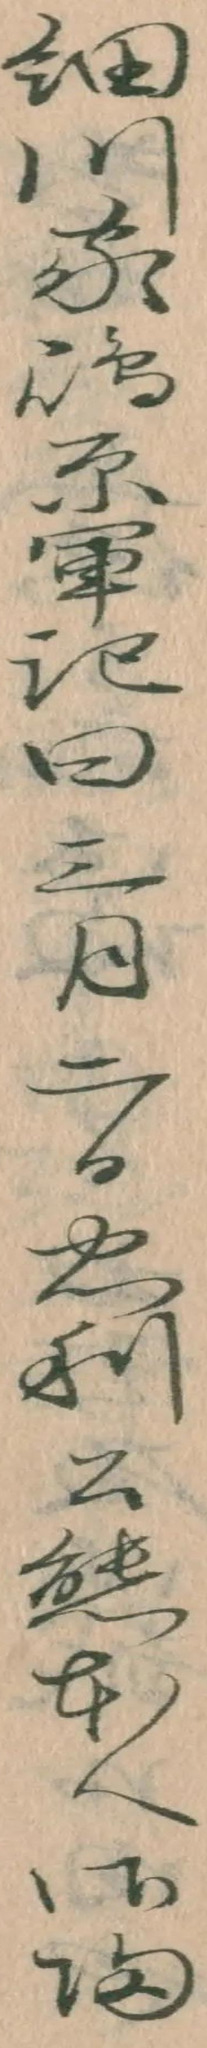細川家島原軍記曰三月二日忠利公熊本へ御帰
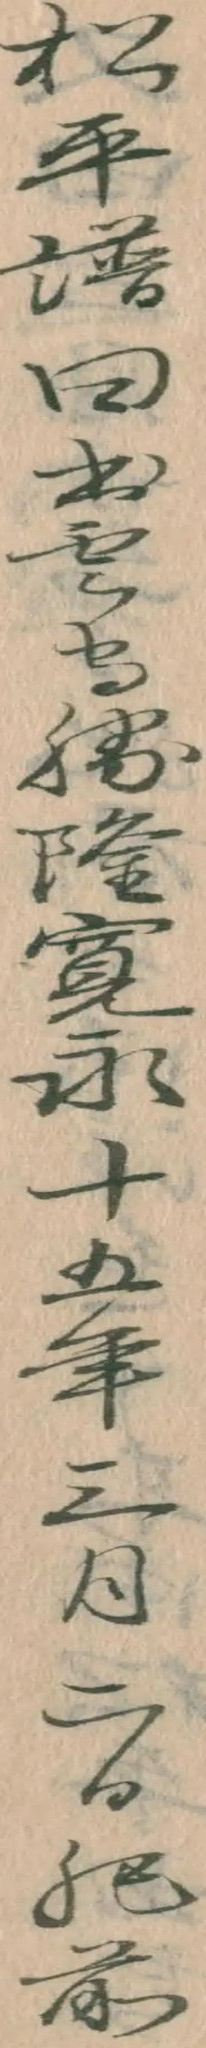松平譜曰出雲守勝隆寛永十五年三月二日肥前
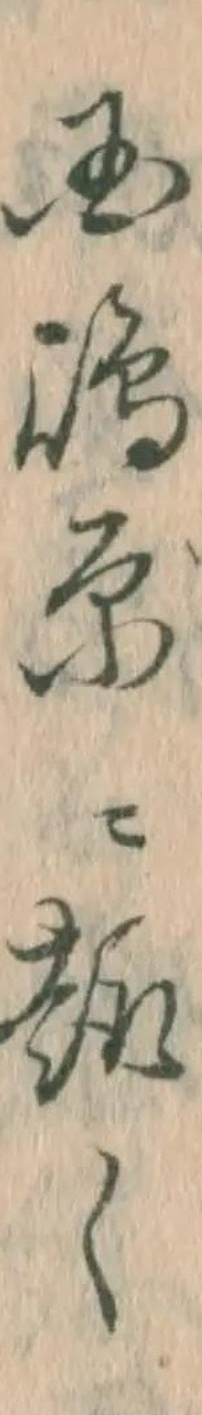国島原に趣く
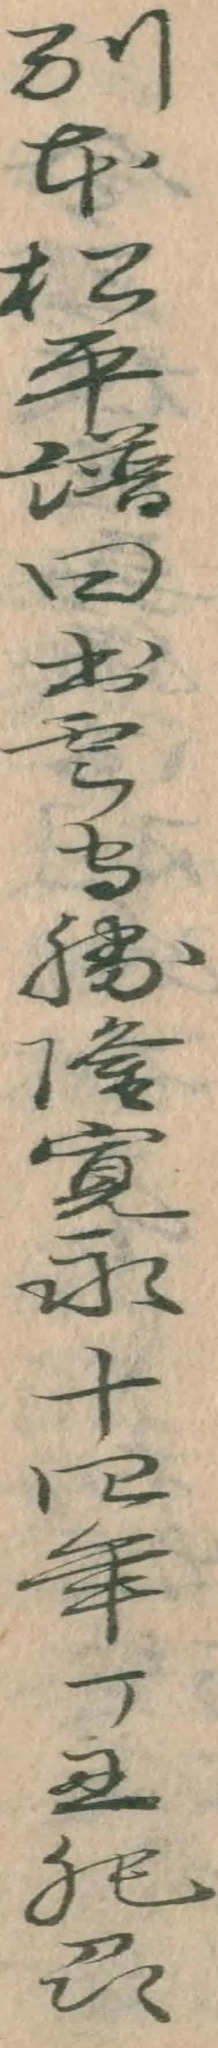別本松平譜曰出雲守勝隆寛永十四年丁丑肥州
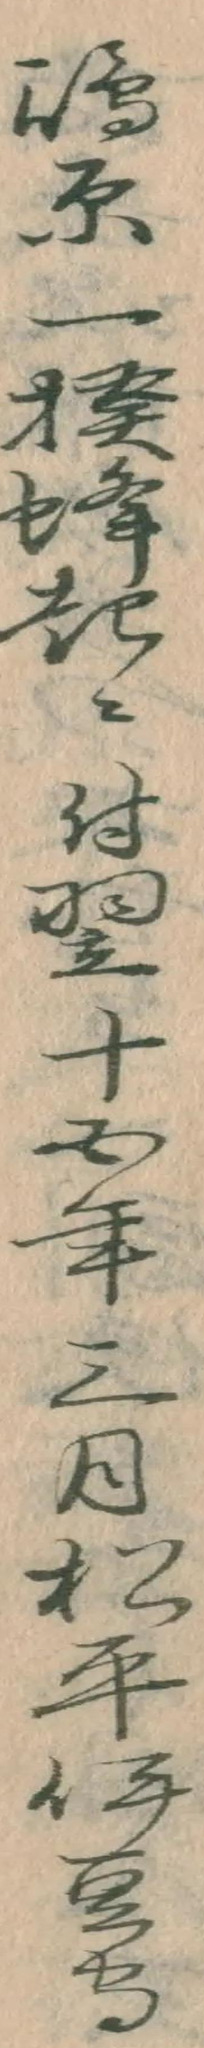島原一揆蜂起に付翌十五年三月松平伊豆守
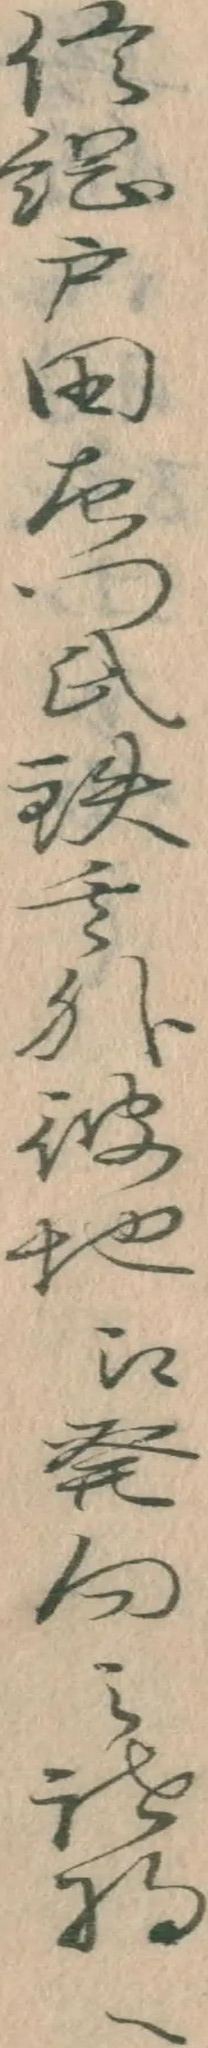信綱戸田左門氏鉄其外彼地江発向之諸将へ
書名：切支丹御退治記 49巻. [9]
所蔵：国立国会図書館 National Diet Library, JAPAN
